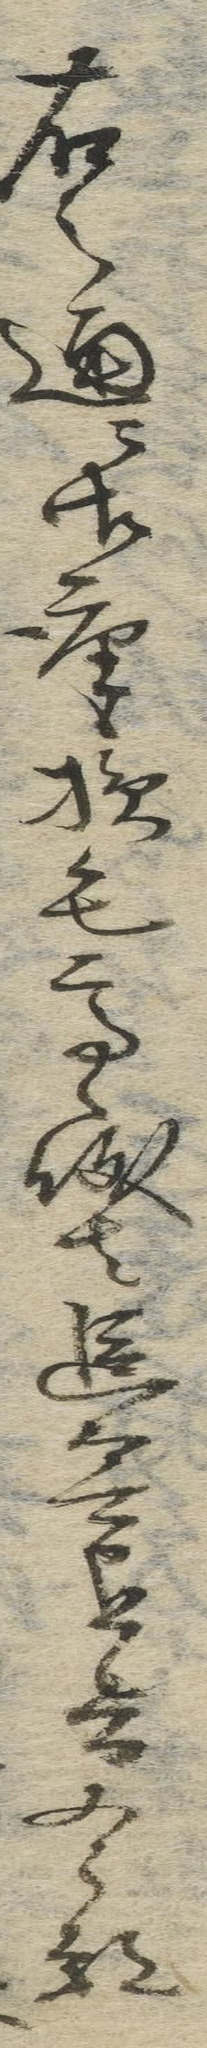右之通二御座候損毛高之儀は追而可申上候間今朝
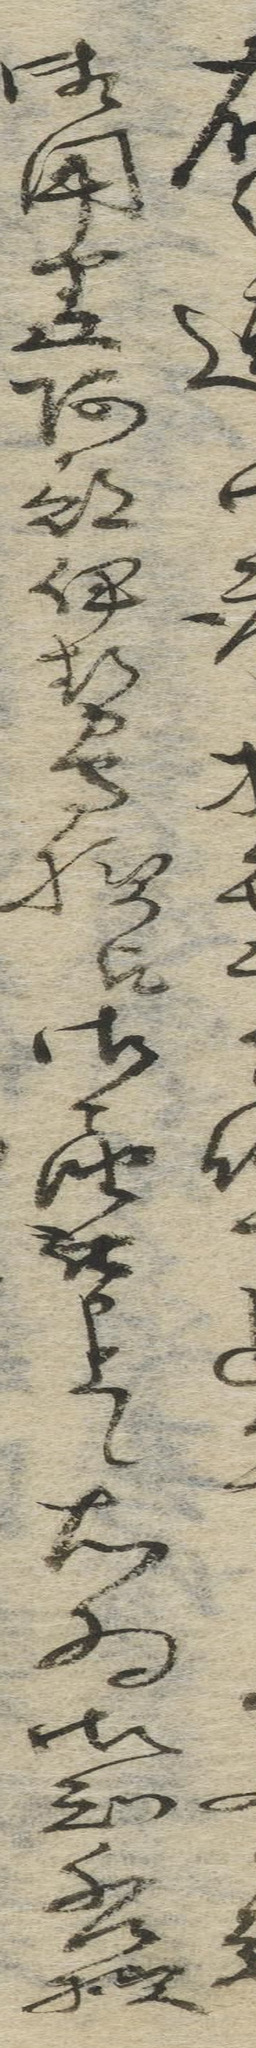御用番阿部伊勢守様江御届被申上候右為御知様
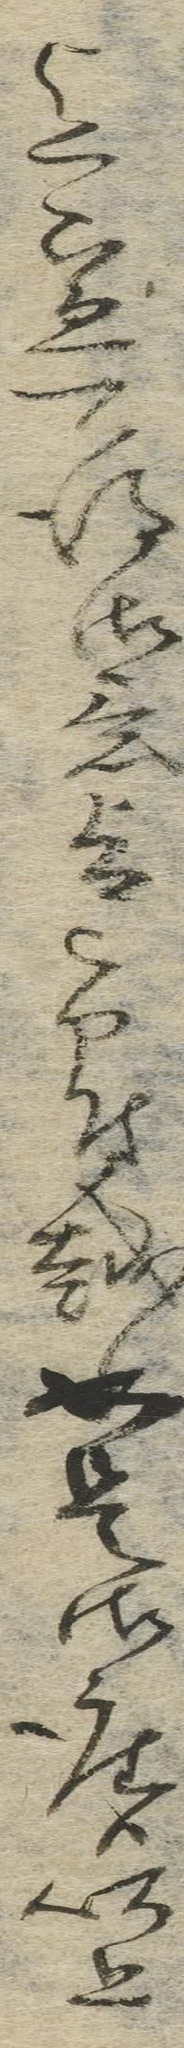申上可得御意旨被申付候趣如是御座候以上
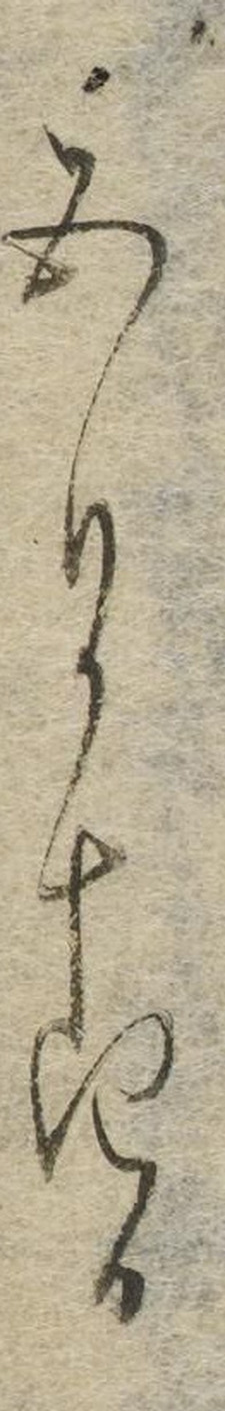五月十四日

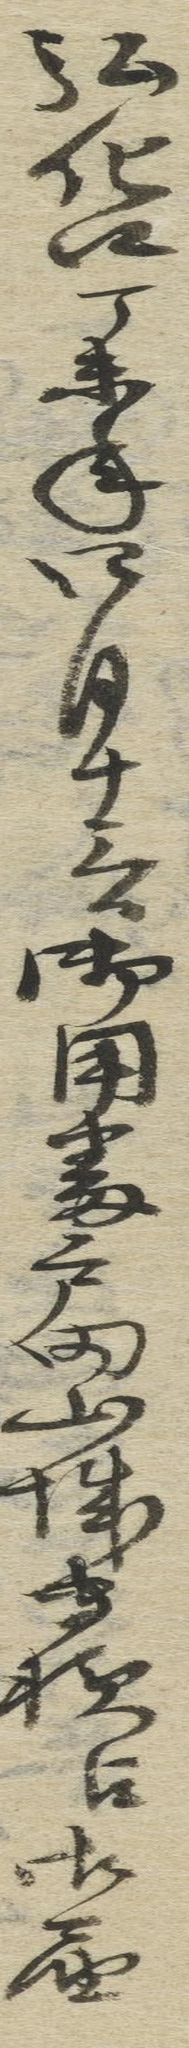弘化四丁未四月十三日御用番戸田山城守様江御届
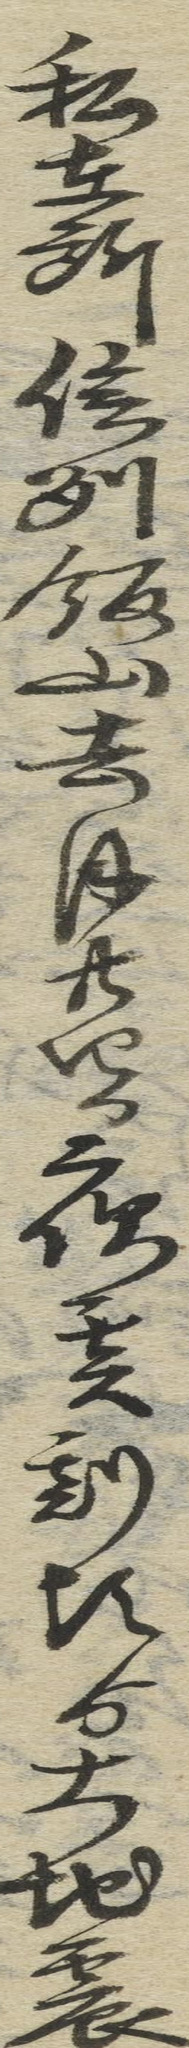私在所信州飯山去月廿四日夜亥刻頃ゟ大地震
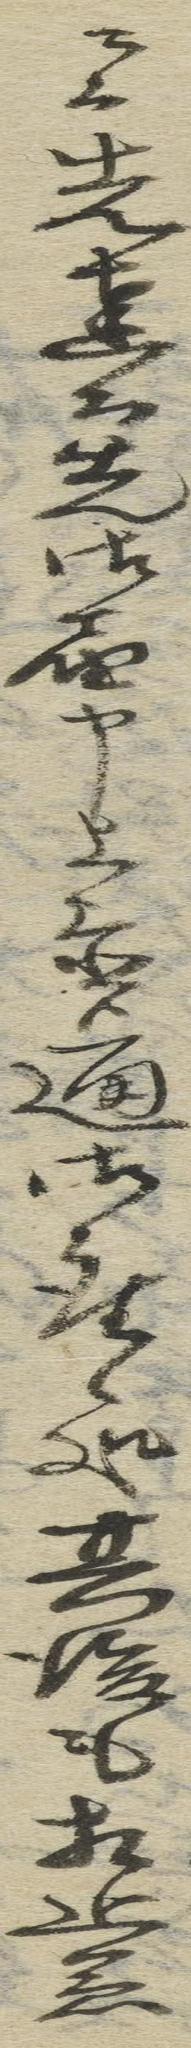二而先達而先御届申上置候通御座候処其後も相止兼
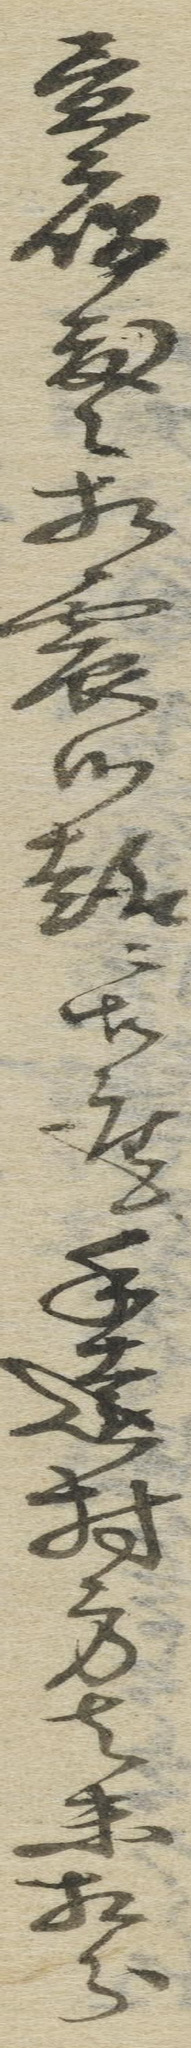昼夜度々相震候趣二御座候手遠村方は未相分
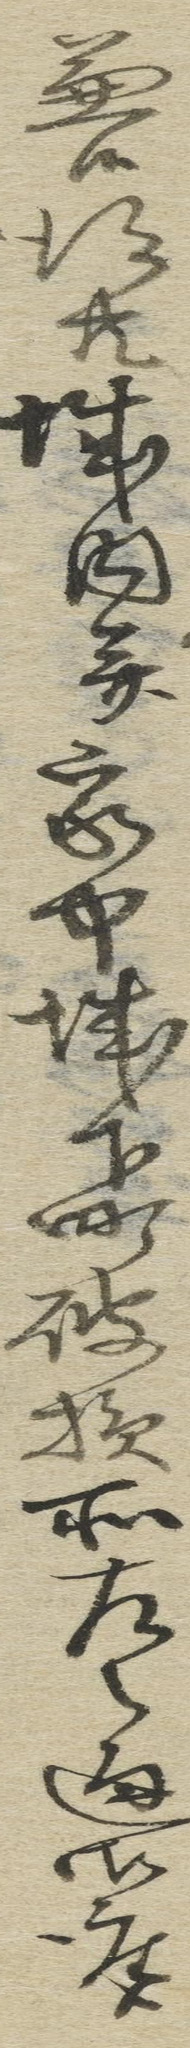兼候得共城内并家中城下町破損所左之通御座候
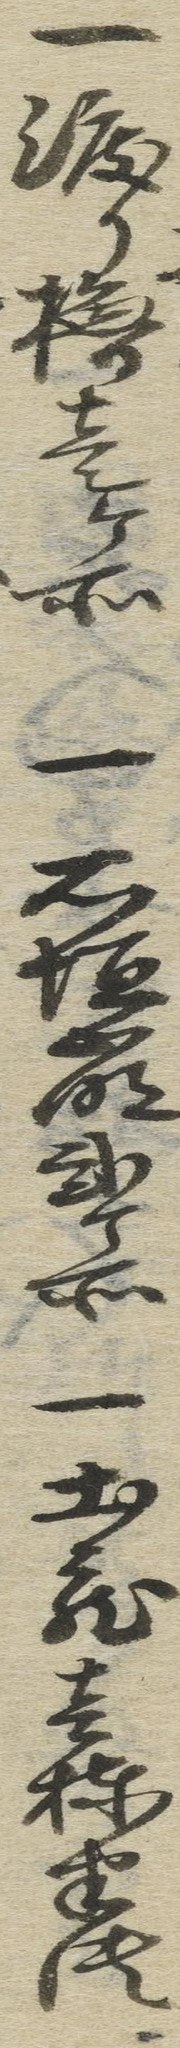一渡櫓壱ヶ所一石垣崩弐ヶ所一土蔵壱棟半潰
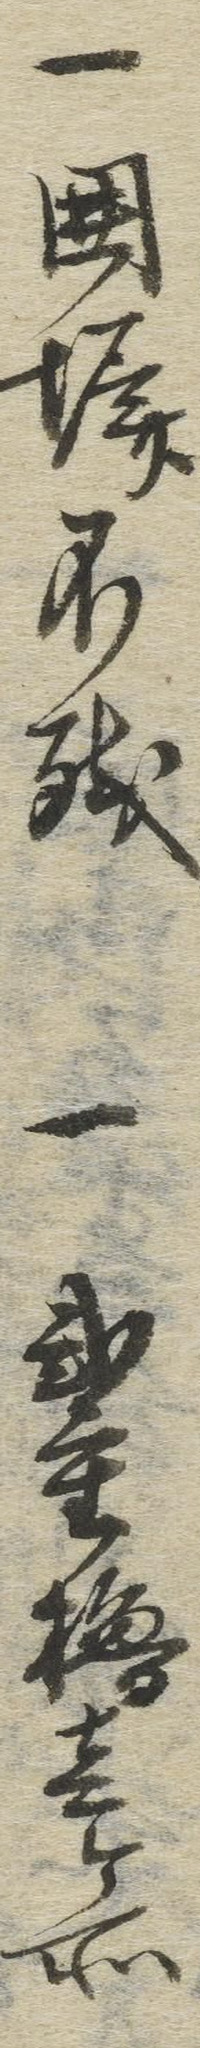一囲塀不残一弐重櫓壱ヶ所
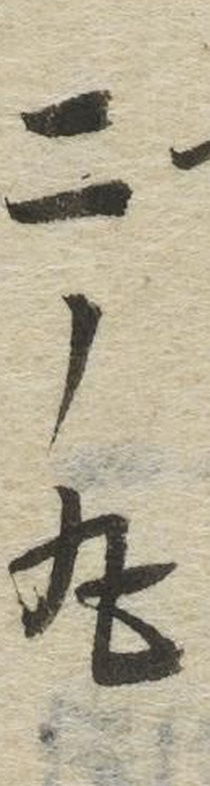二ノ丸
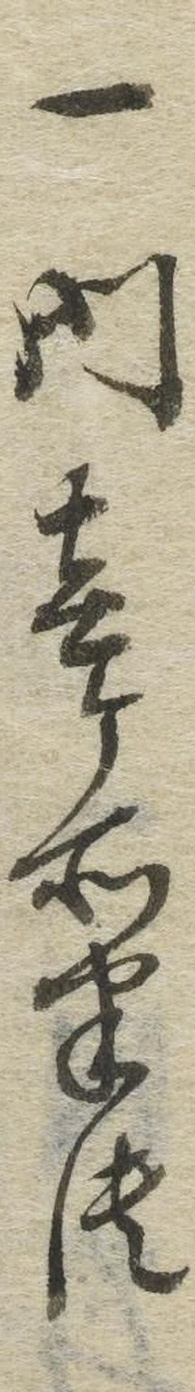一橋壱ヶ所潰
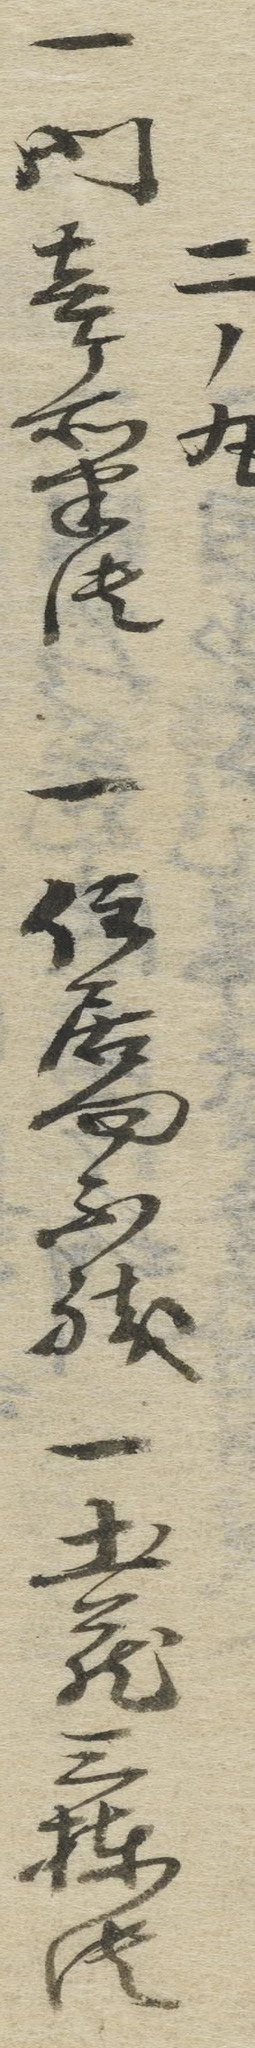一門壱ヶ所半潰一住居向不残一土蔵三棟潰
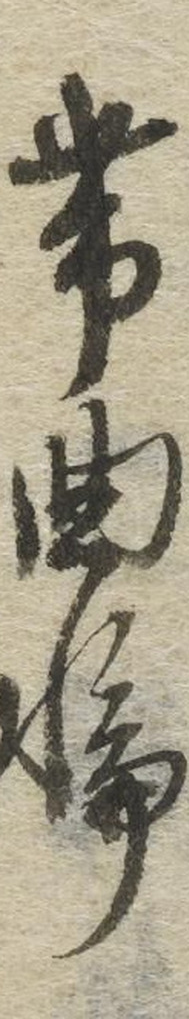帯曲輪
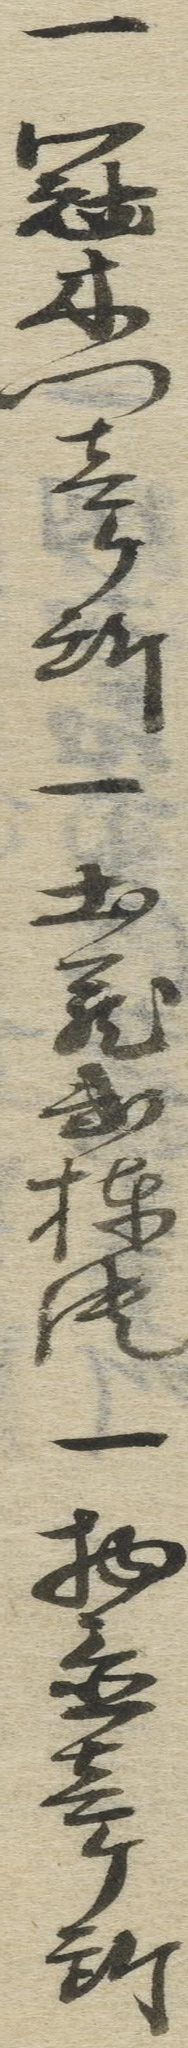一冠木門壱ヶ所一土蔵弐棟潰一物置一ヶ所潰
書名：信濃越後　地震書留
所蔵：東京大学地震研究所図書室 Earthquake Research Institute Library, The University of Tokyo, JAPAN
